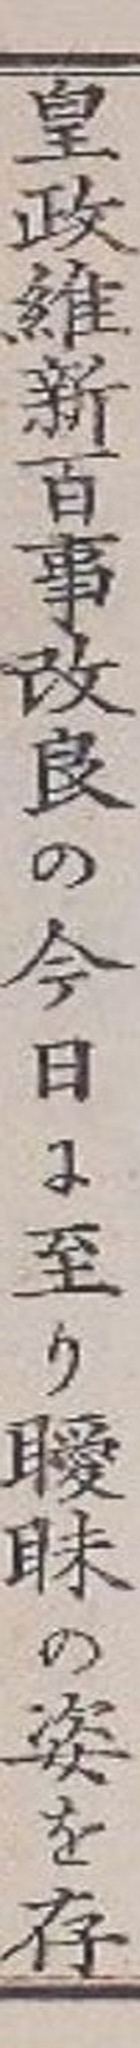皇政維新百事改良の今日に至り曖昧の姿を存

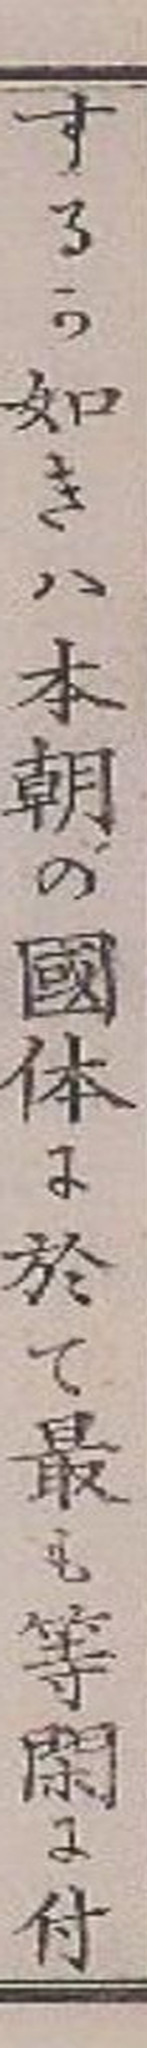するか如きは本朝の国体に於て最も等閑に付
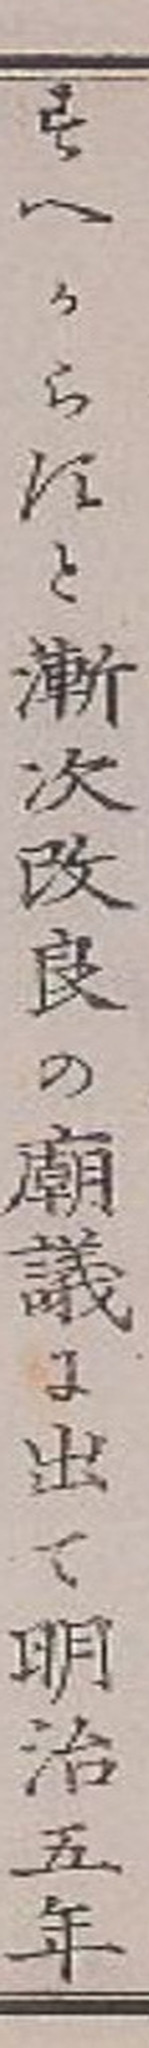すへからすと漸次改良の廟議に出て明治五年
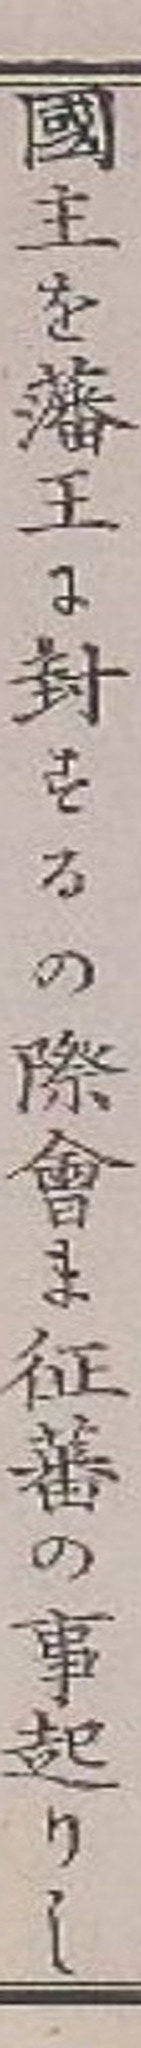国主を藩王に封するの際会ま征蕃の事起りし
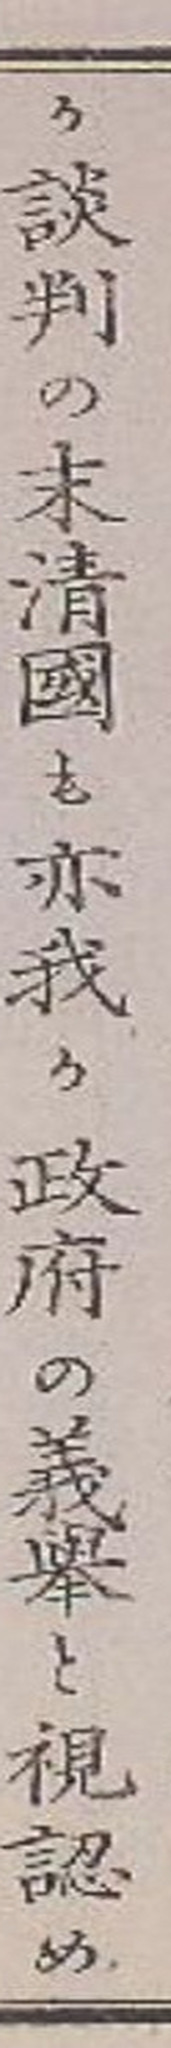か談判の末清国も亦我か政府の義挙と視認め
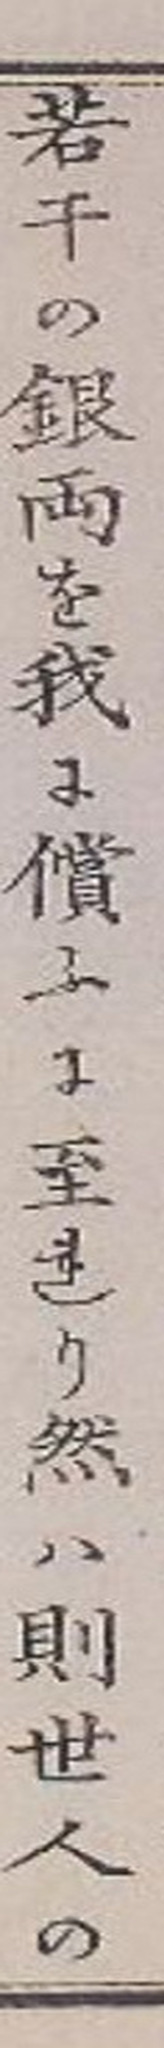若干の銀両を我に償ふに至れり然は即世人の
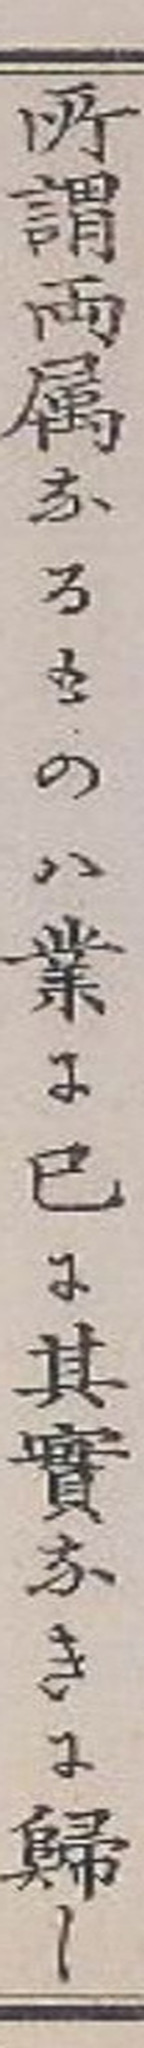所謂両属なるものは業に巳に其実なきに帰し
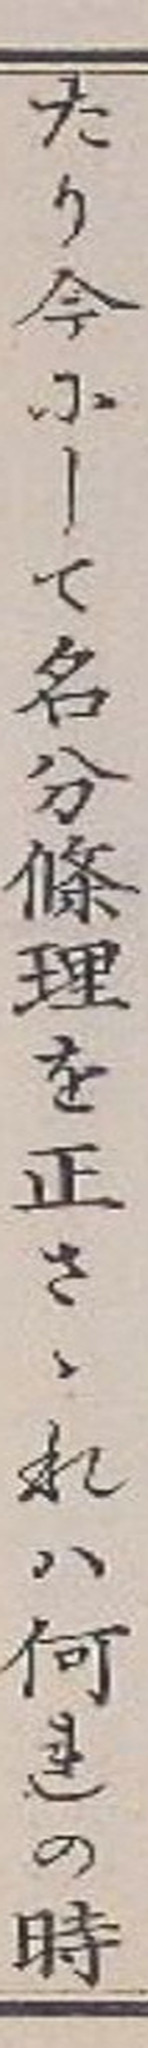たり今にして名分条理を正さゝれは何れの時
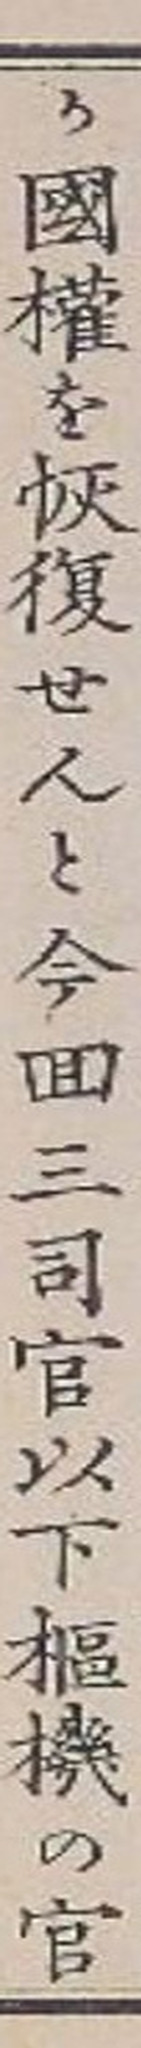か国権を恢復せんと今回三司官以下枢機の官
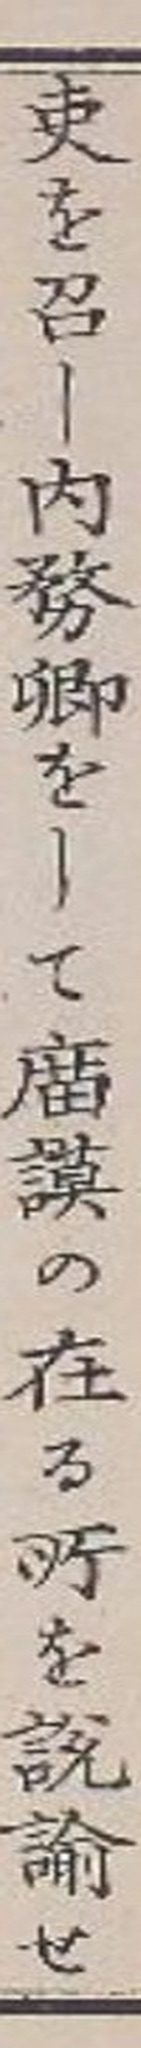吏を召し内務卿をして庿謨の在る所を説諭せ
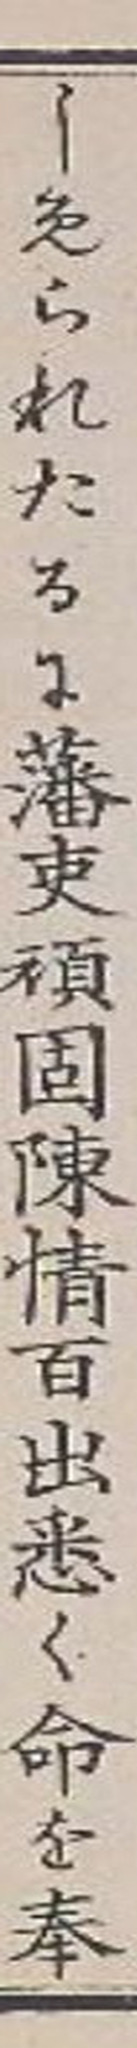しめられたるに藩吏頑固陳情百出悉く命を奉
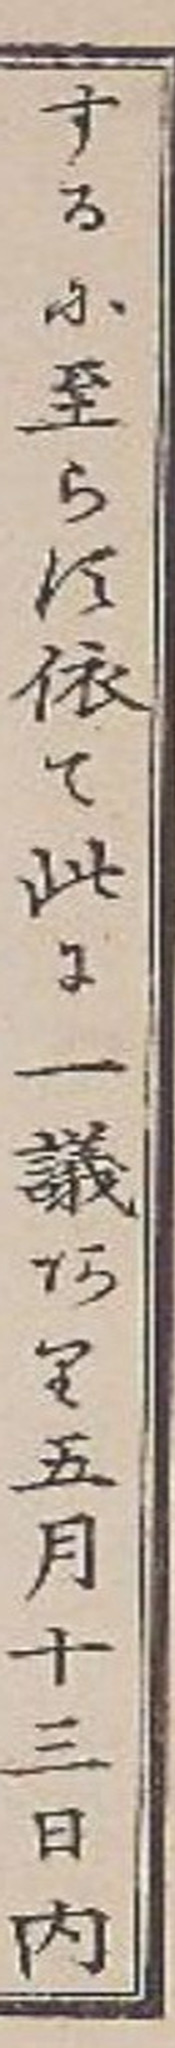するに至らす依て此に一議あり五月十三日内
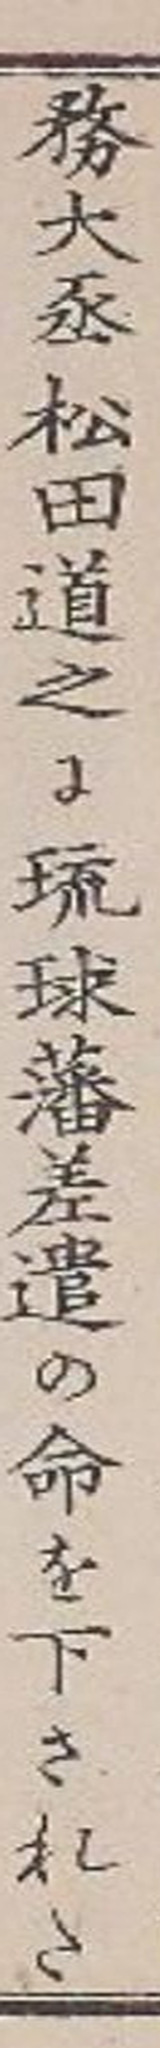務大丞松田道之に琉球藩差遣の命を下された
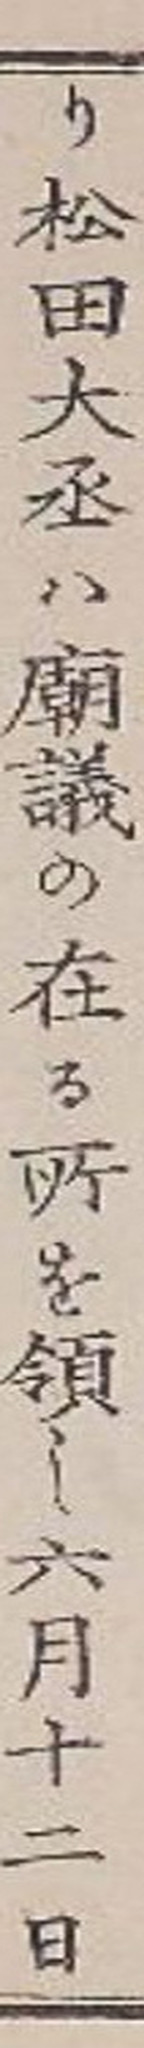り松田大丞は廟議の在る所を領し六月十二日
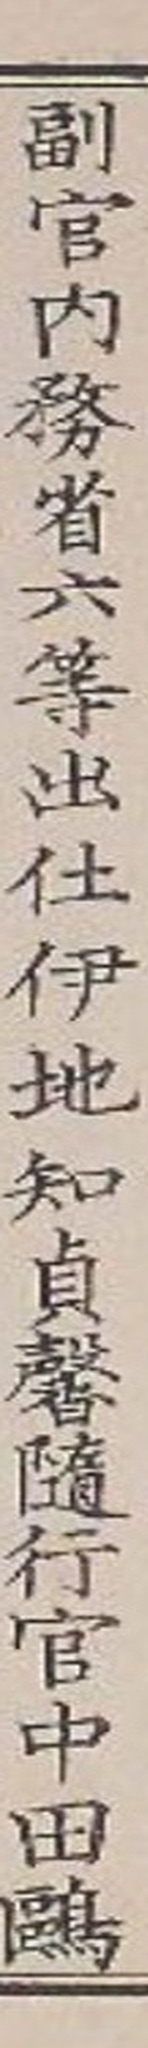副官内務省六等出仕伊地知貞馨随行官中田鴎
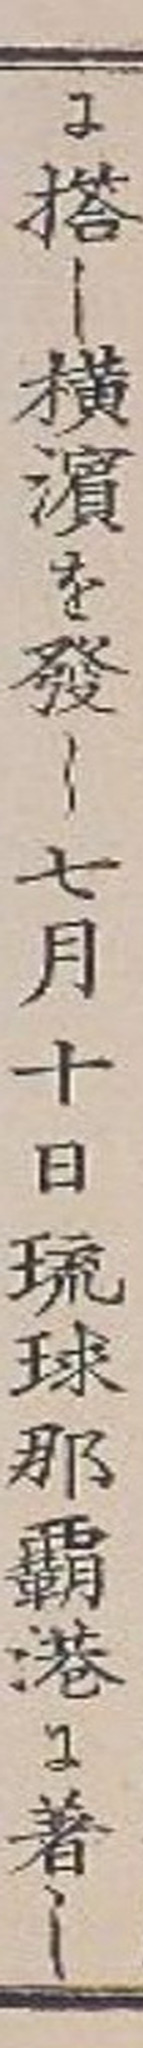に搭し横浜を発し七月十日琉球那覇港に着し
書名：南島紀事 下
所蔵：University of the Ryukyus Library
